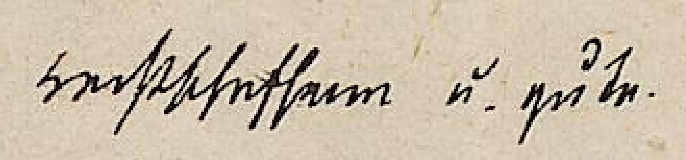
rechtschaffene u. gute.
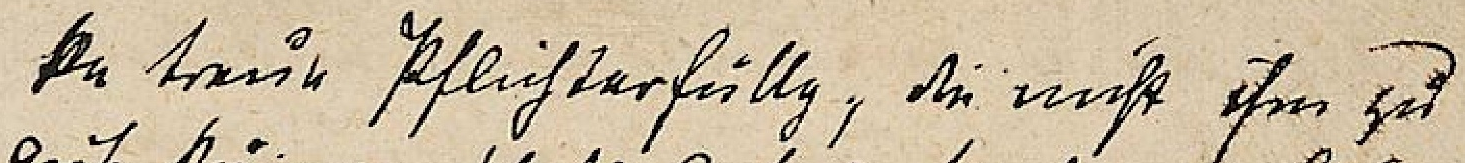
kn treue Pflichterfüllg, nie nicht im z
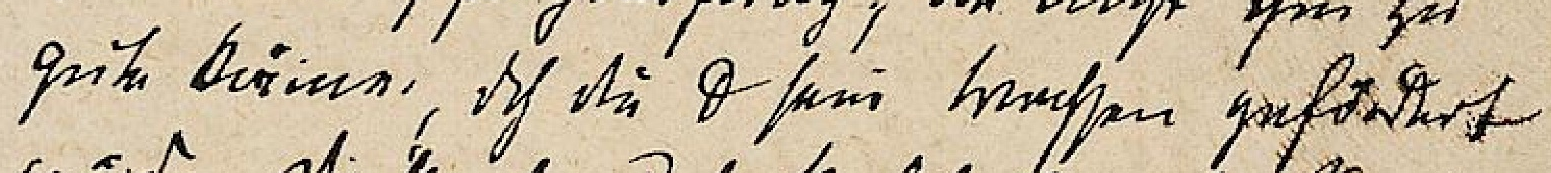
gute käme, dch die o sein Wachsen gefördert
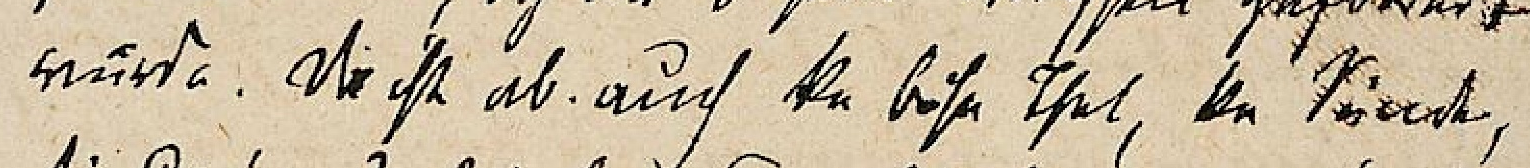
würde. Da ist auch kn böse That, kn Sünde,
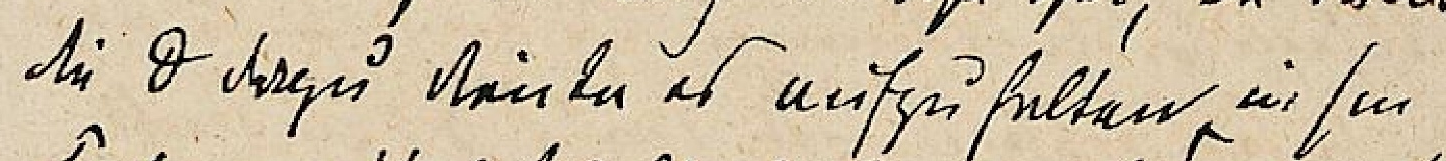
die o dazu diente es aufzuhalten, in sm
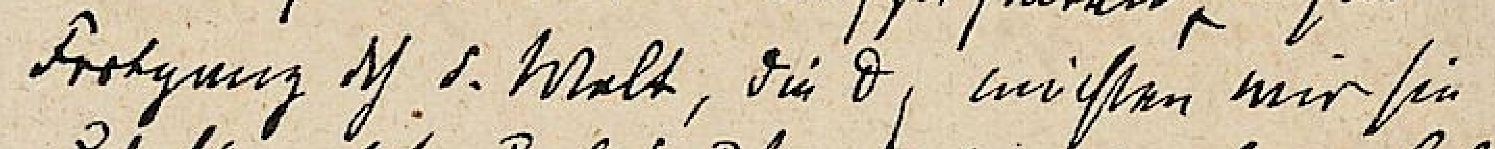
Fortgang dch d. Welt, die o, möchten wir sie
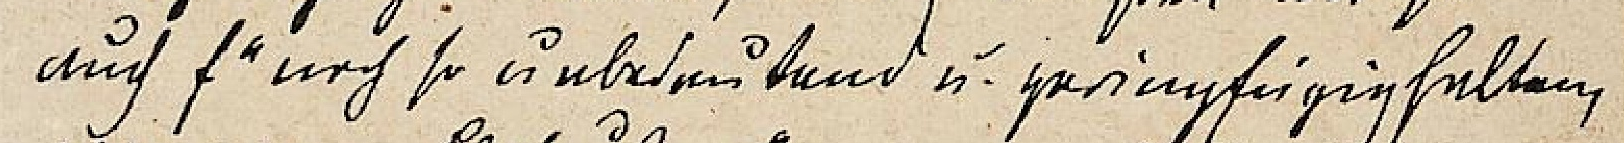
auch fü noch so unbedeutend u. geringfügig halten,
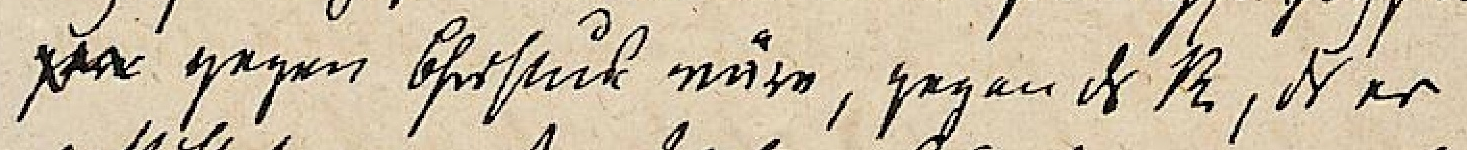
gar gegen Christus wäre, gegen ds R., ds er
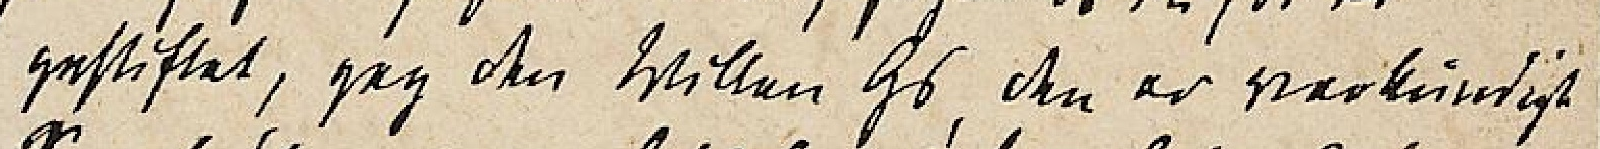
gestiftet, geg den Willen Gs, den er verkündigt.
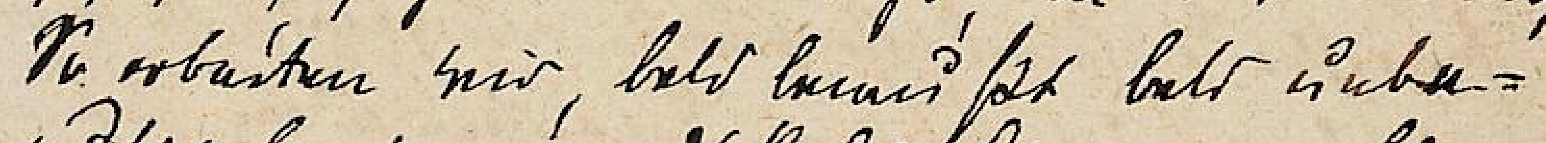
So arbeiten wir, bald bewußt bald unbe¬
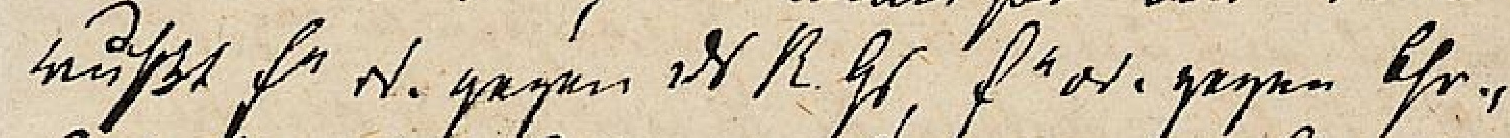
wußt fü od. gegen ds R. Gs, fü od. gegen Chr.,
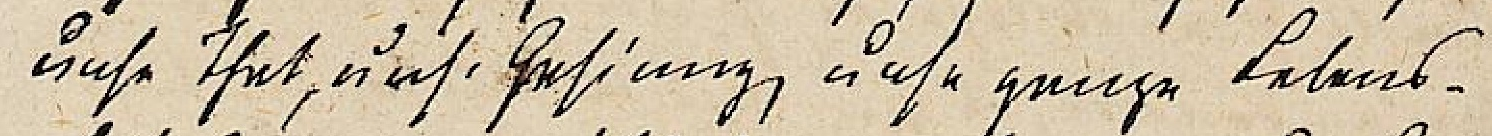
unsr That, uns. Gesinng, unsr ganze Lebens¬
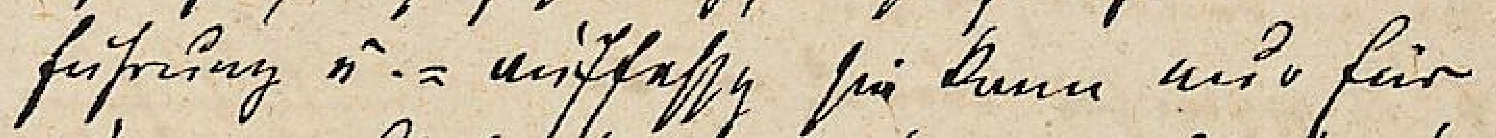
führung u. - auffassg sie kann nur für
